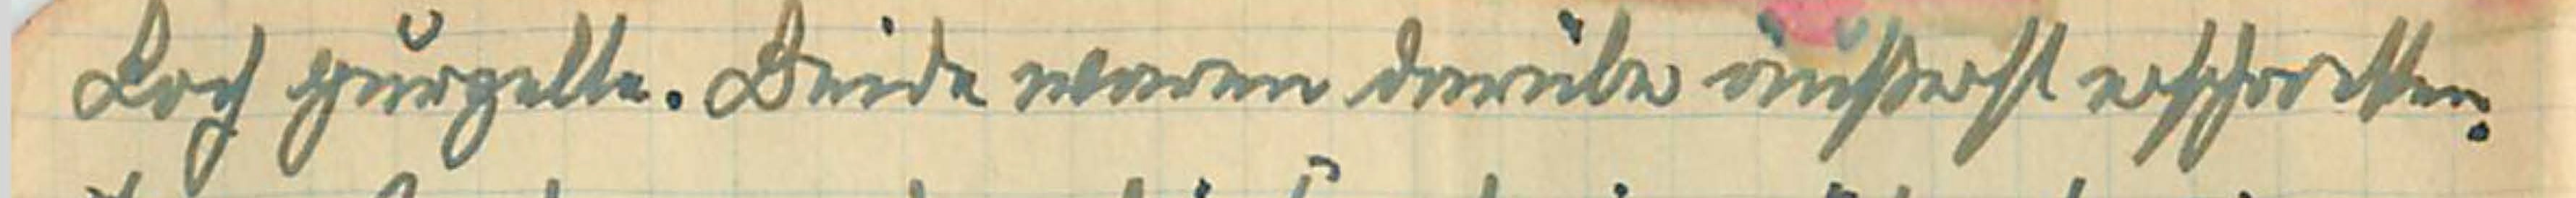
Loch purzelte. Beide waren darüber äußerst erschrocken.
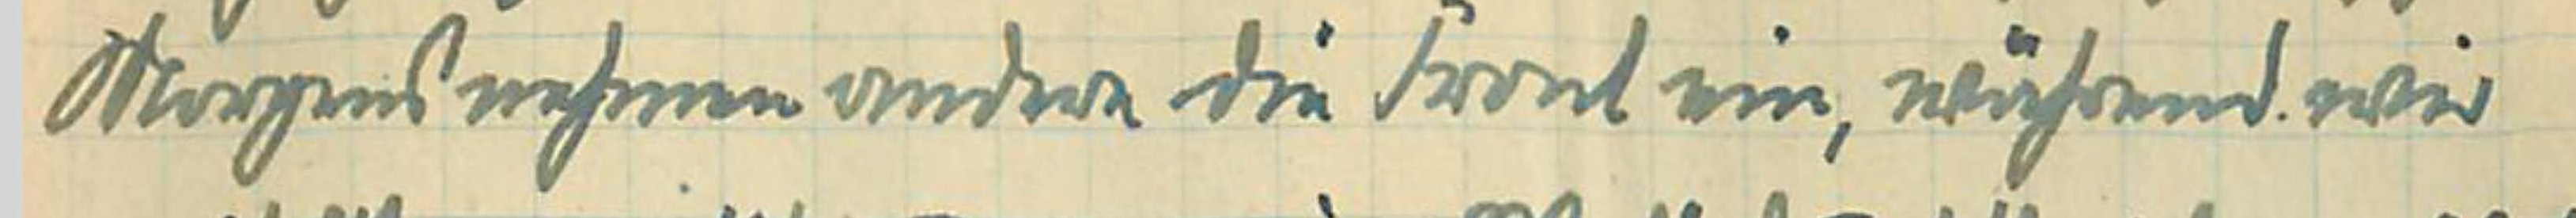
Morgens nehmen andere die Front ein, während wir
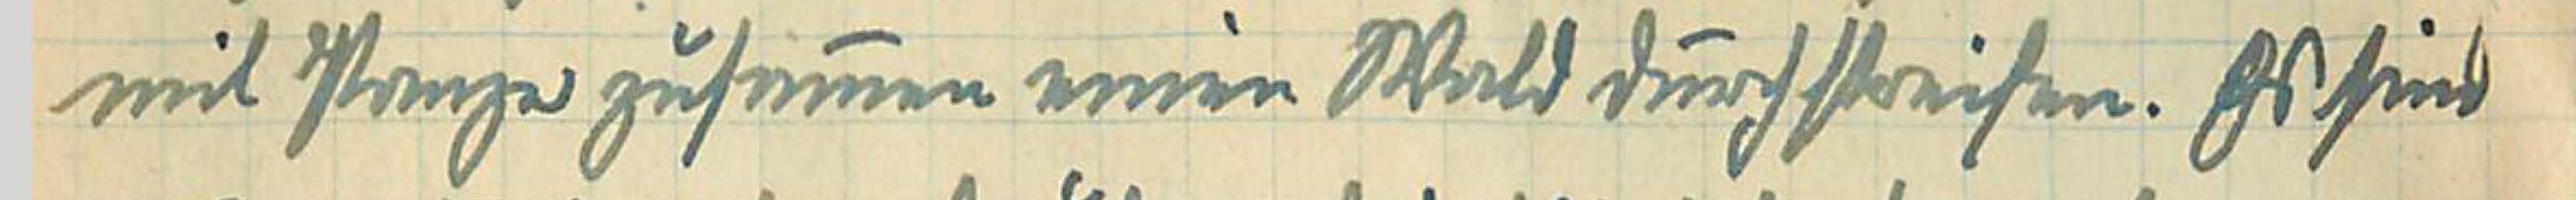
mit Panzer zusammen einen Wald durchstreifen. Es sind
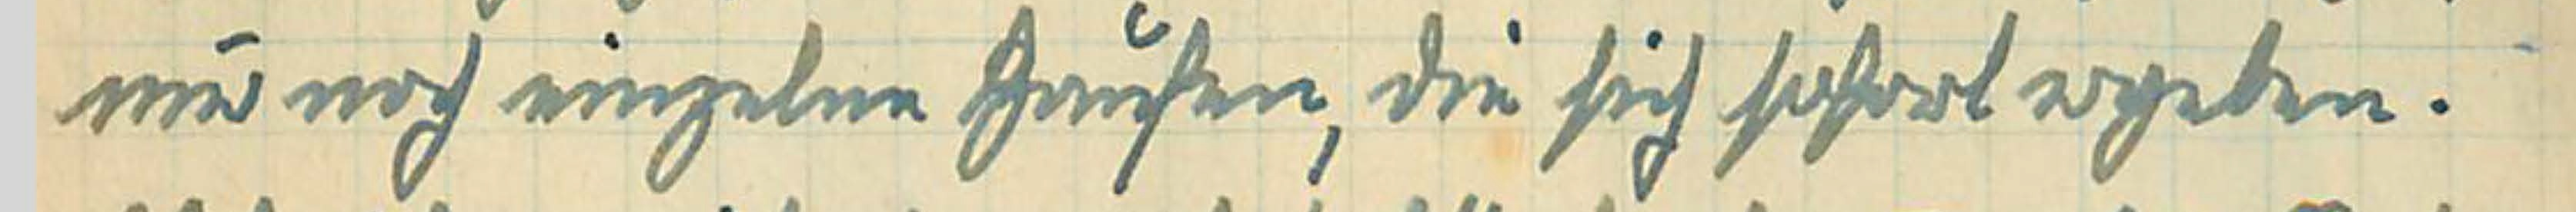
nur noch einzelne Haufen, die sich sofort ergeben.
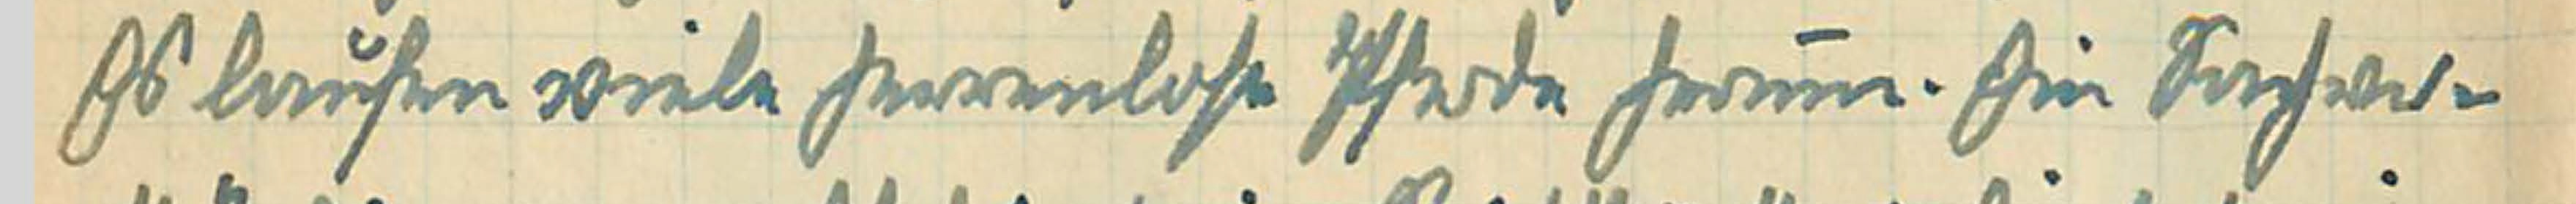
Es laufen viele herrenlose Pferde herum. Ein Sachver-
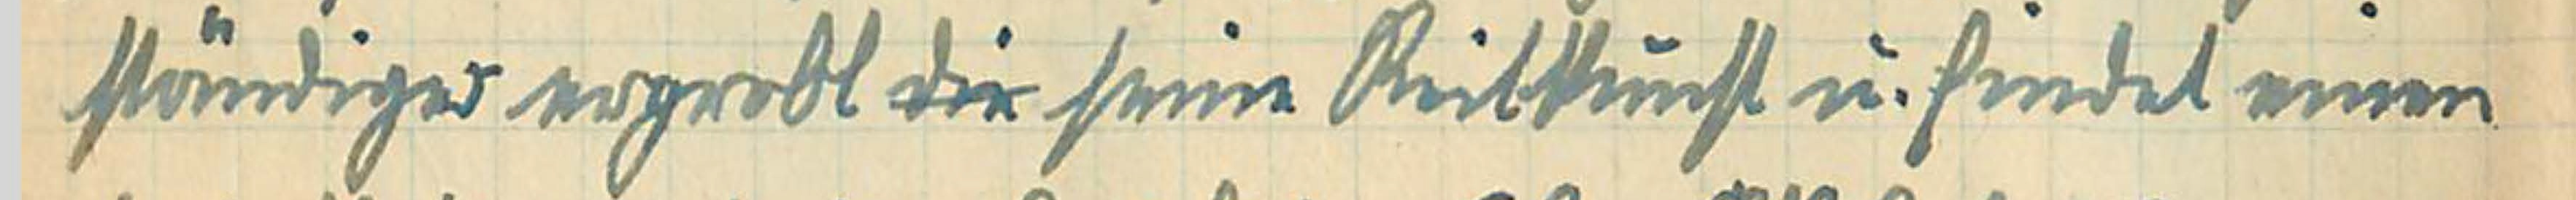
ständiger erprobt die seine Reitkunst u. findet einen
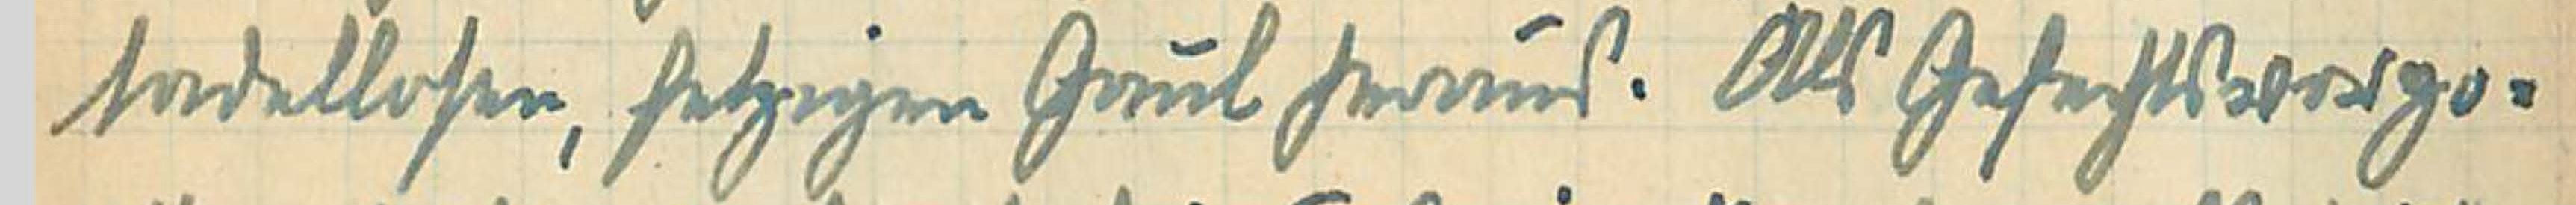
tadellosen, fetzigen Gaul heraus. Als Gefechtsvorpo-
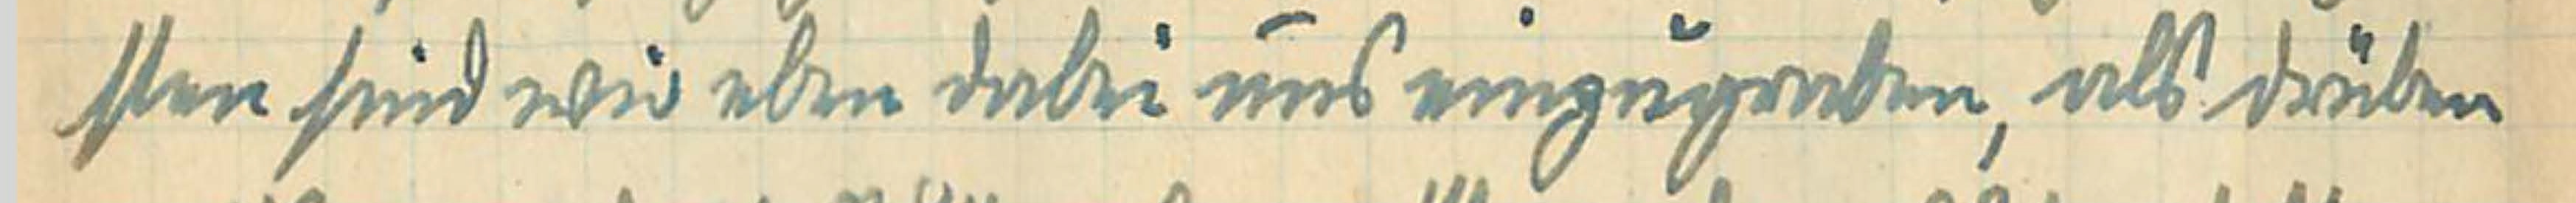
sten sind wir eben dabei uns einzugraben, als drüben
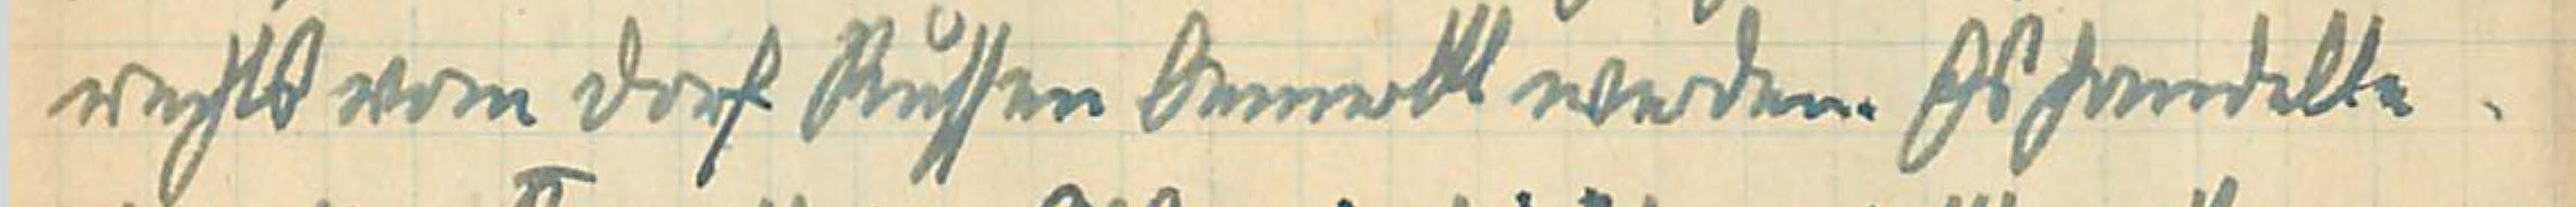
rechts vom Dorf Russen bemerkt werden. Es handelte
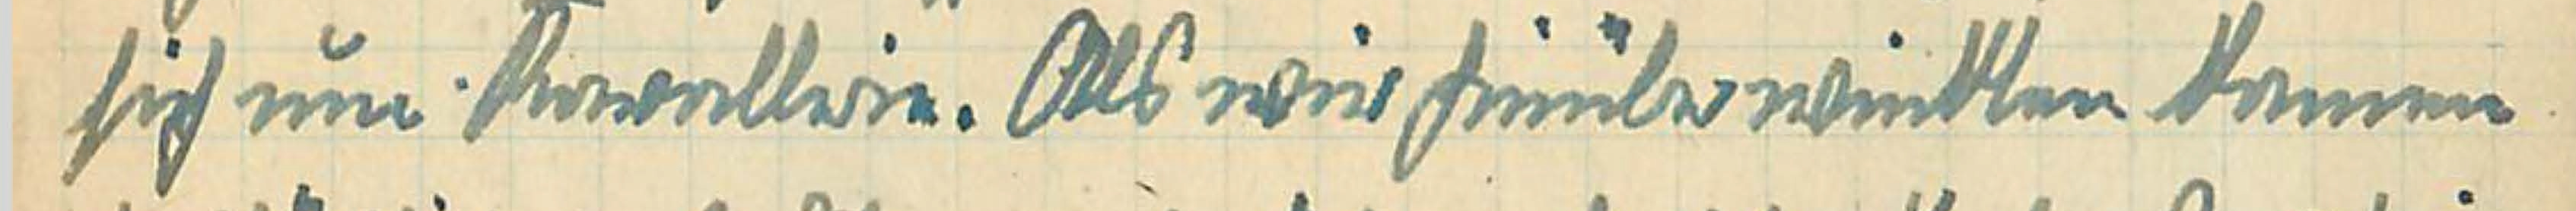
sich um Kavallerie. Als wir hinüberwinkten kamen
